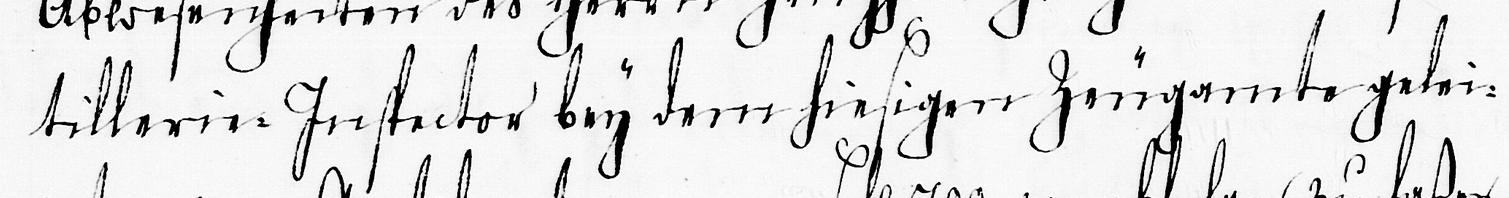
tillerie-Inspector bey dem hiesigen Zeugamte gelei¬
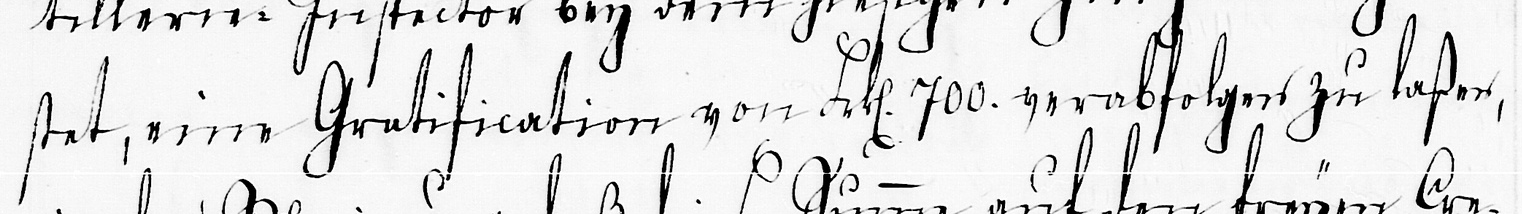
stet, eine Gratification von Frk[en]. 700. verabfolgen zu laßen,
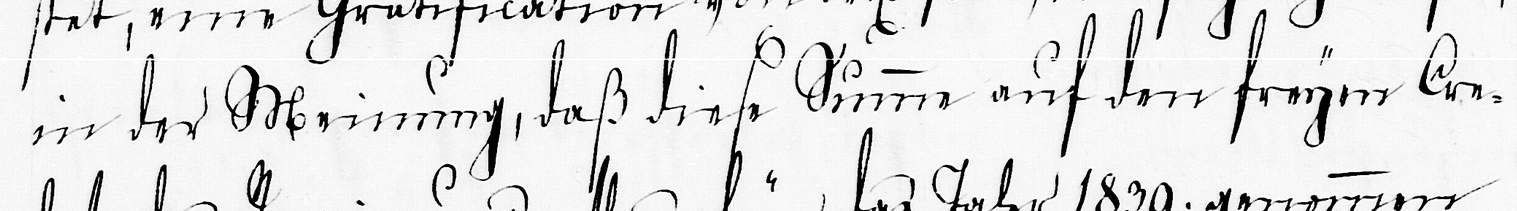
in der Meinung, daß diese Summe auf den freyen Cre¬
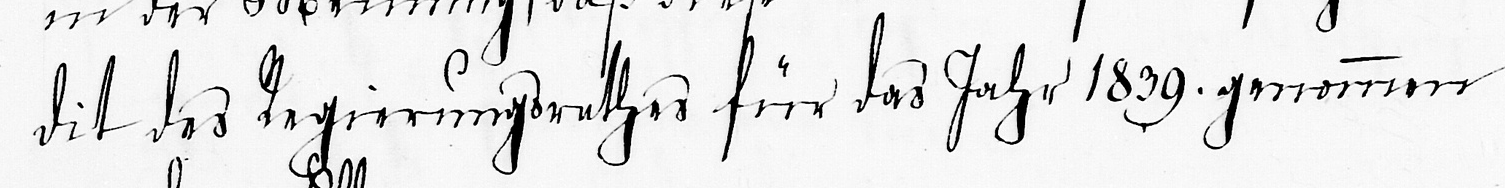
dit des Regierungsrathes für das Jahr 1839. genommen
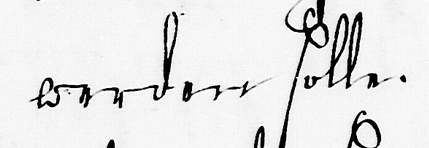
werden solle.
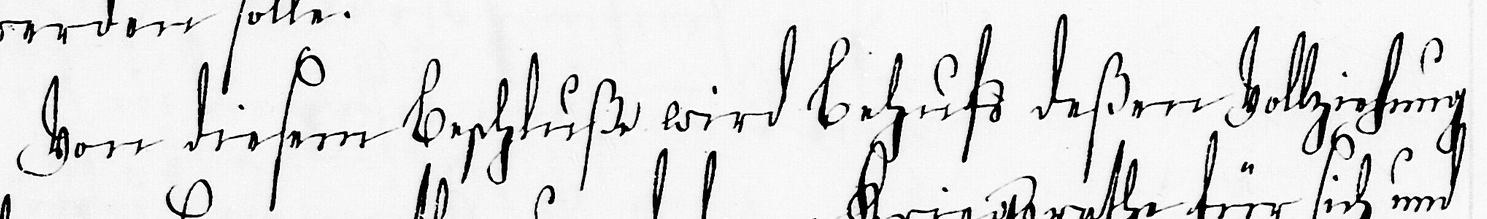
Von diesem Beschluße wird Behufs deßen Vollziehu¬
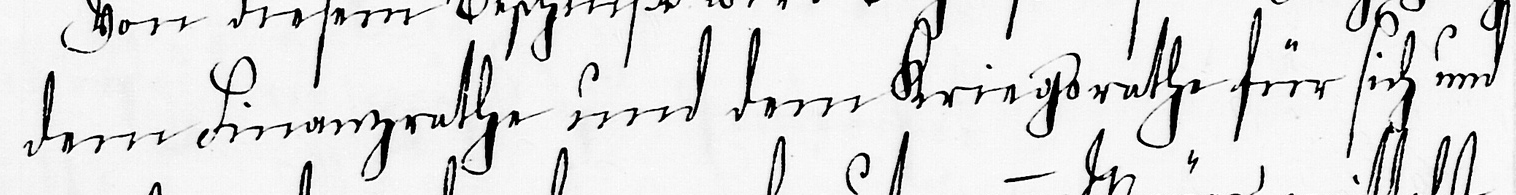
dem Finanzrathe und dem Kriegsrathe für sich und
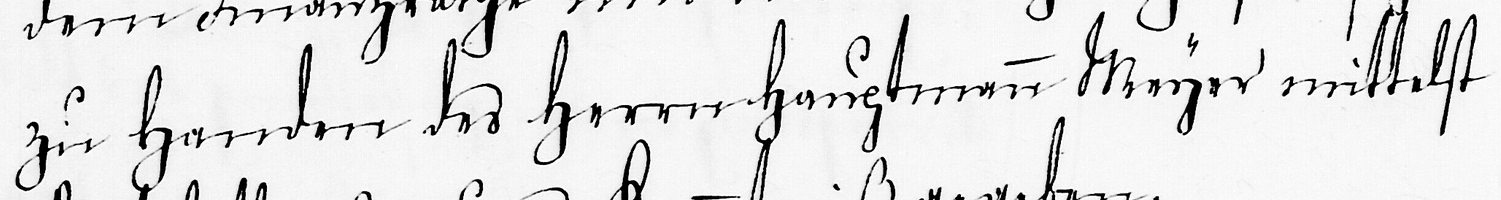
zu Handen den Herrn Hauptmann Meyer mittelst
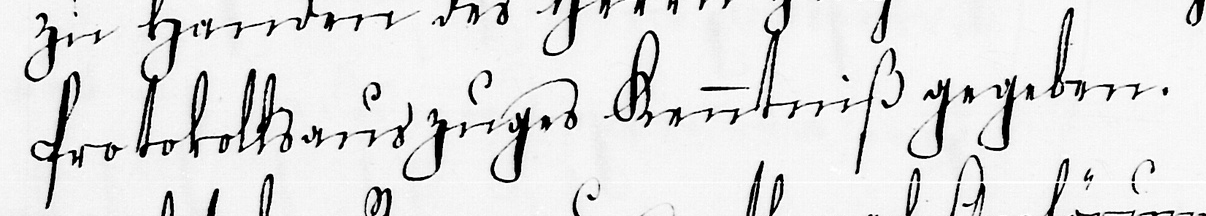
Protokollsauszuges Kenntniß gegeben.
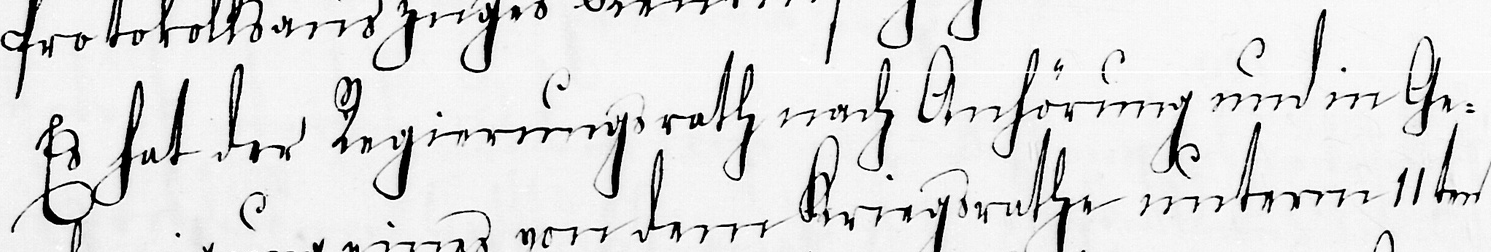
Es hat der Regierungsrath nach Anhörung und in Ge¬
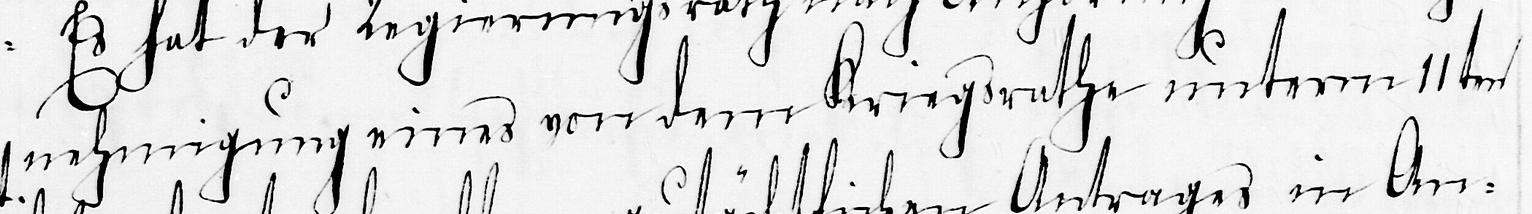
nehmigung eines von dem Kriegsrathe unterm 11ten
